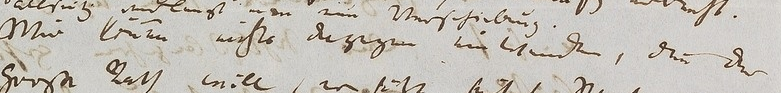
Wir können nichts dagegen einwenden, denn der
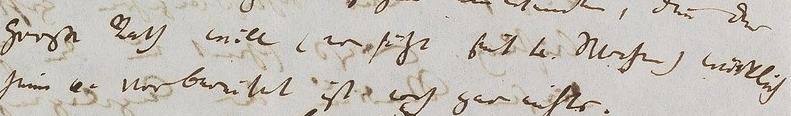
Große Rath will (er sitzt seit 4 Wochen) wirklich
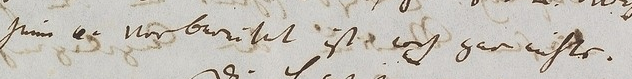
heim &. vorbereitet ist noch gar nichts.
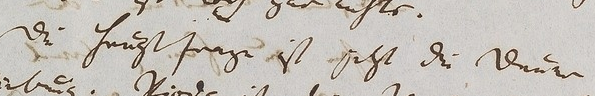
Die Hauptfrage ist jetzt die Dauer
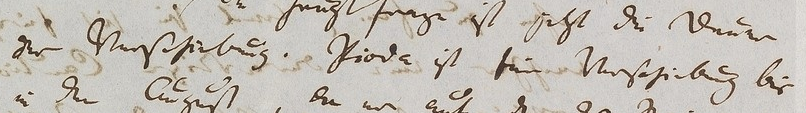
der Verschiebung. Pioda ist für Verschiebung bis
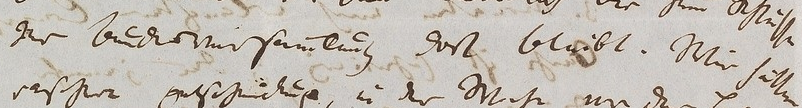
der Bundesversammlung dort bleibt. Wir hätten
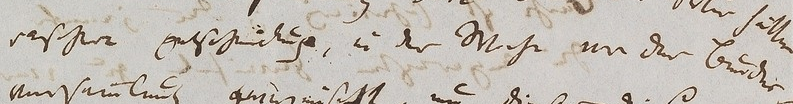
raschere Entscheidung, in der Woche vor der Bundes-
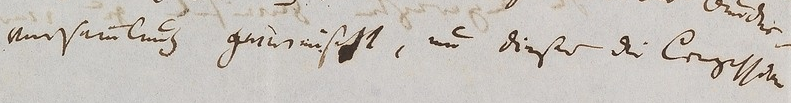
versammlung gewünscht, um dieser die Conzession
